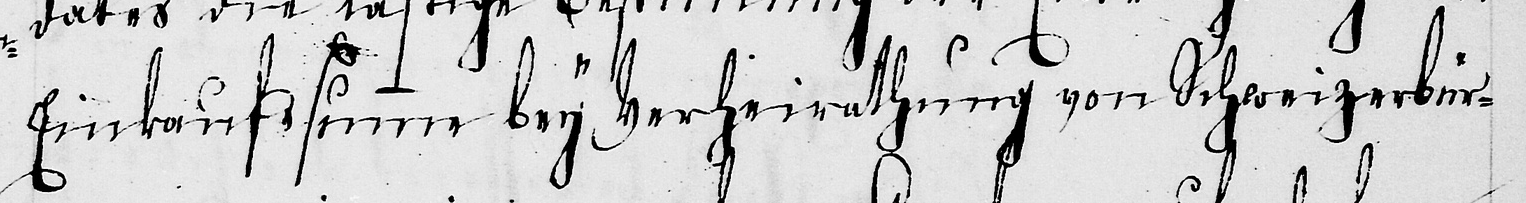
Einkaufssumme bey Verheirathung von Schweizerbür¬
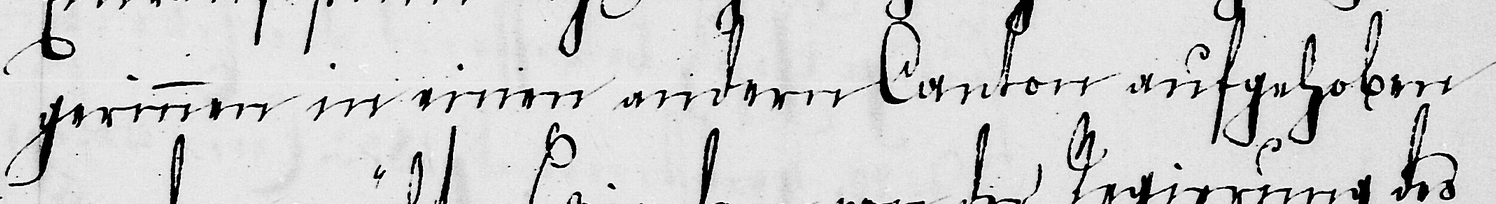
gerinnen in einen andern Canton aufgehoben
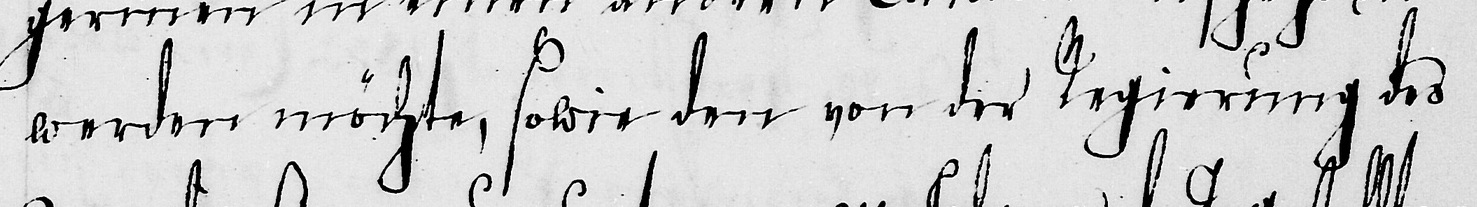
werden möchte, sowie den von der Regierung des
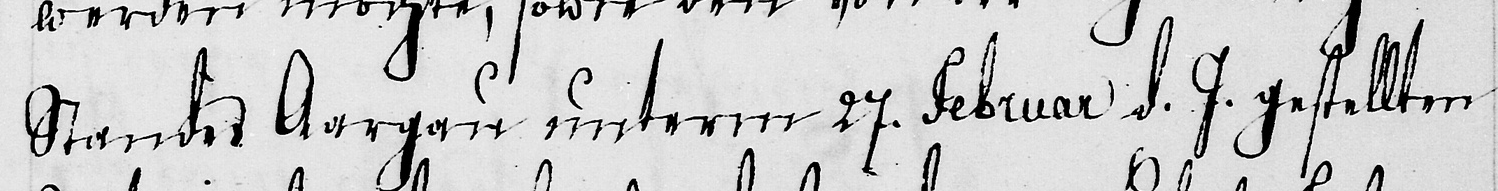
Standes Aargau unterm 27. Februar d. J. gestellten
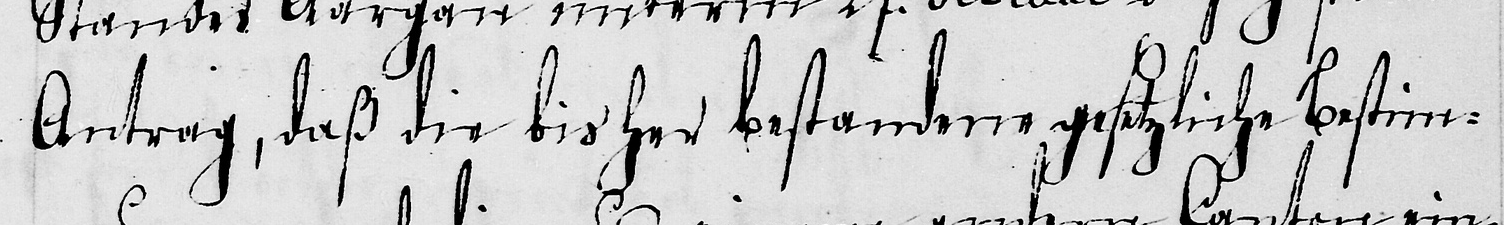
Antrag, daß die bisher bestandene gesetzliche Bestim¬
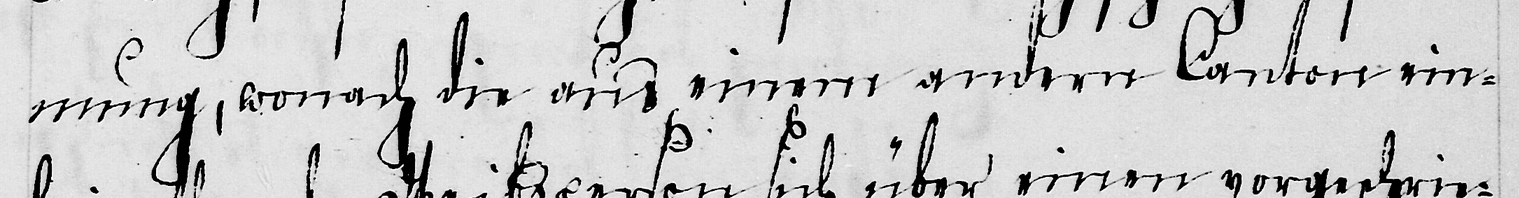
mung, wonach die aus einem andern Canton ein¬
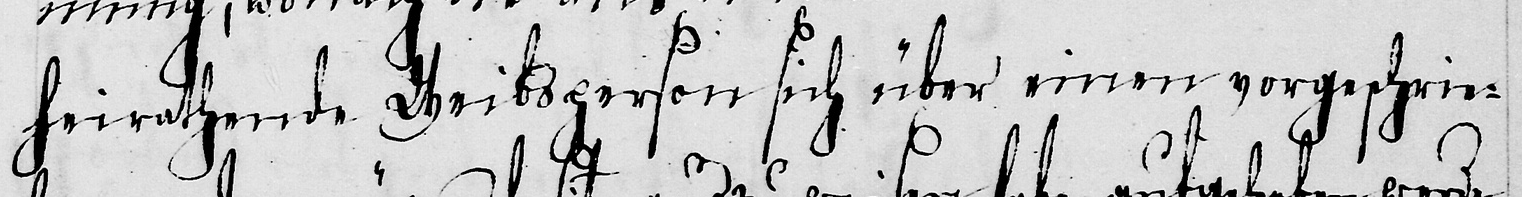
heirathende Weibsperson sich über einen vorgeschrie¬
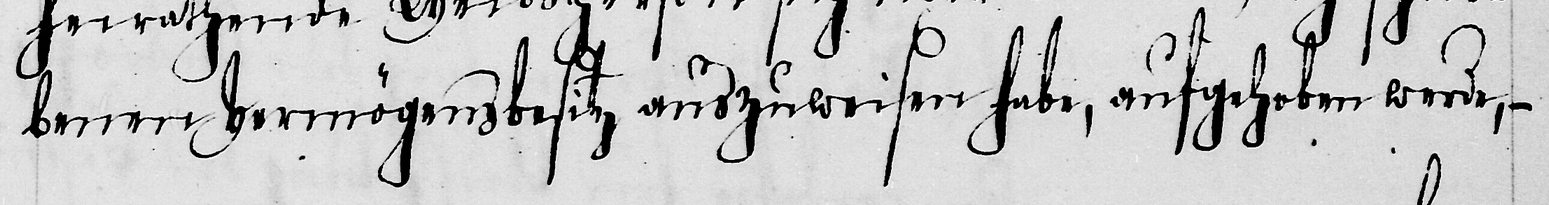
benen Vermögensbesitz auszuweisen habe, aufgehoben werde,
